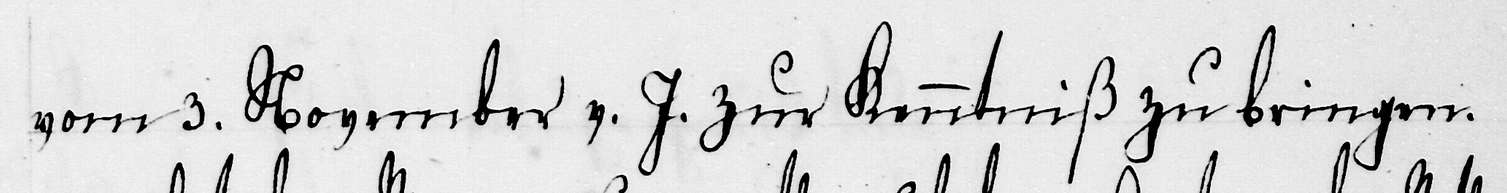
vom 3. November v. J. zur Kenntniß zu bringen.
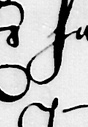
nd
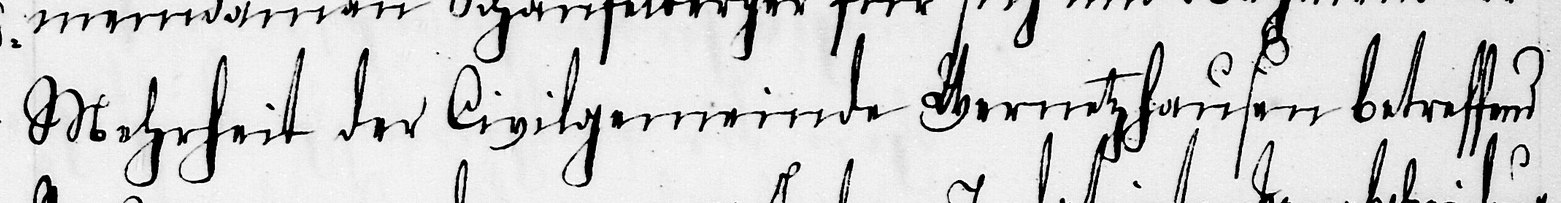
Mehrheit der Civilgemeinde Wernetzhausen betreffe¬
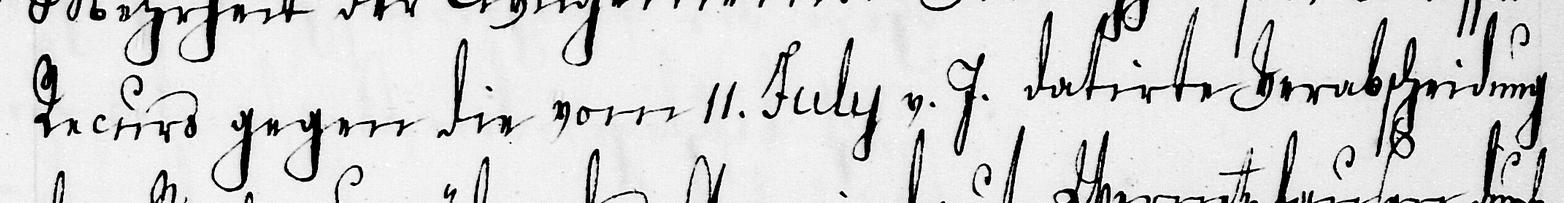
Recurs gegen die vom 11. July v. J. datirte Verabscheidung
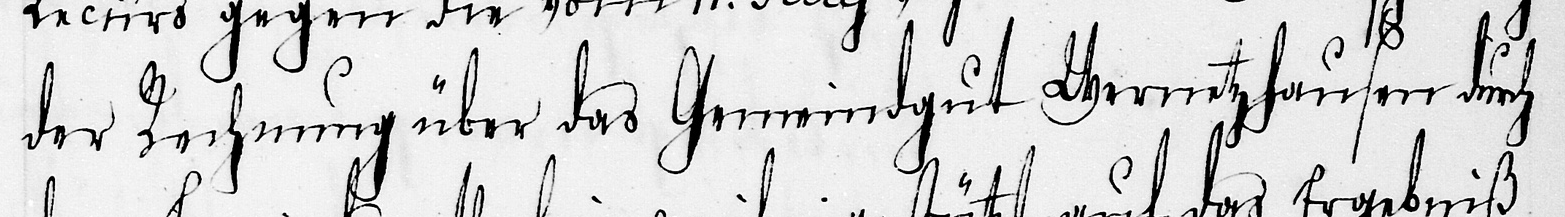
der Rechnung über das Gemeindgut Wernetzhausen durch
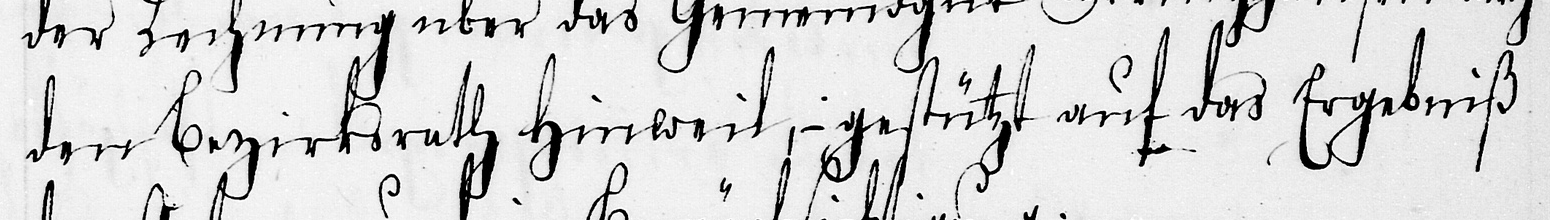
den Bezirksrath Hinweil, – gestützt auf das Ergebniß
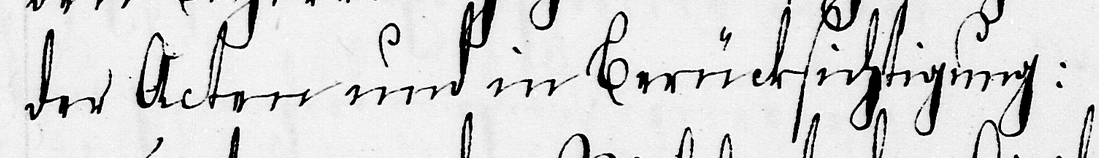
der Acten und in Berücksichtigung:
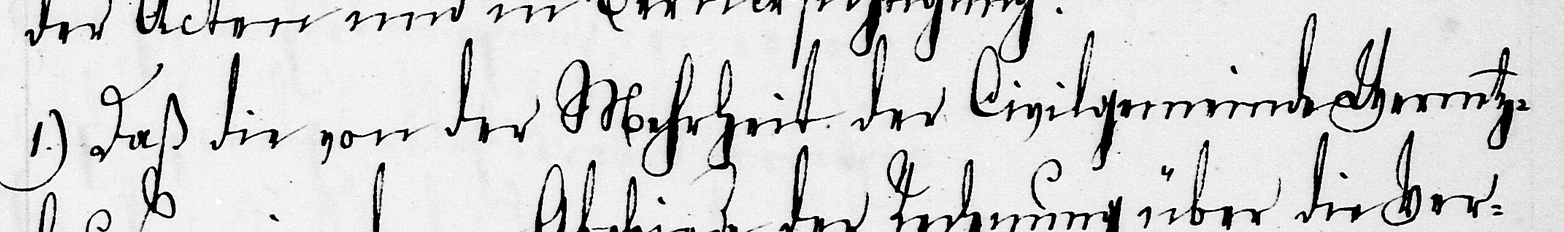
1.) Daß die von der Mehrheit der Civilgemeinde Wernetz¬
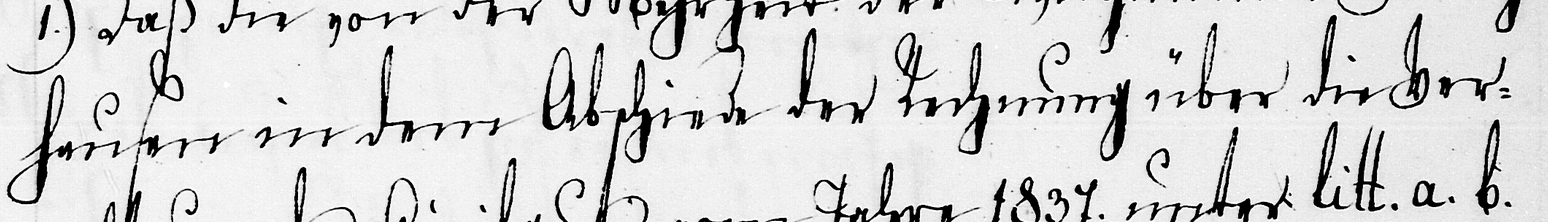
hausen in dem Abschiede der Rechnung über die Ver¬
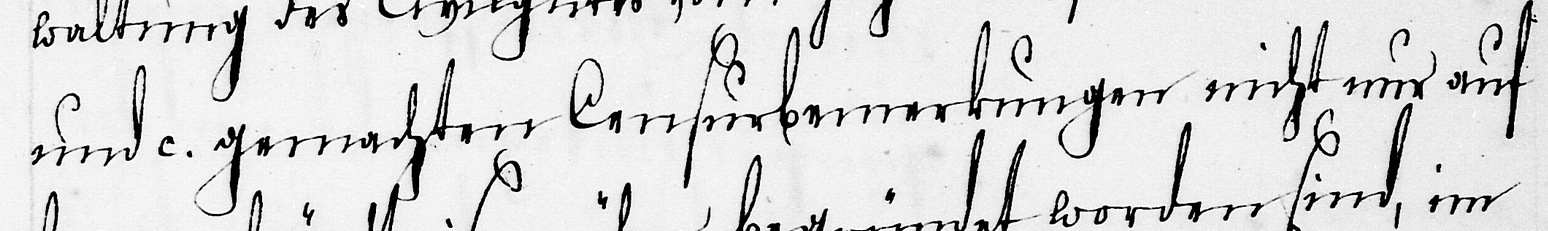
und c. gemachten Censurbemerkungen nicht nur auf
